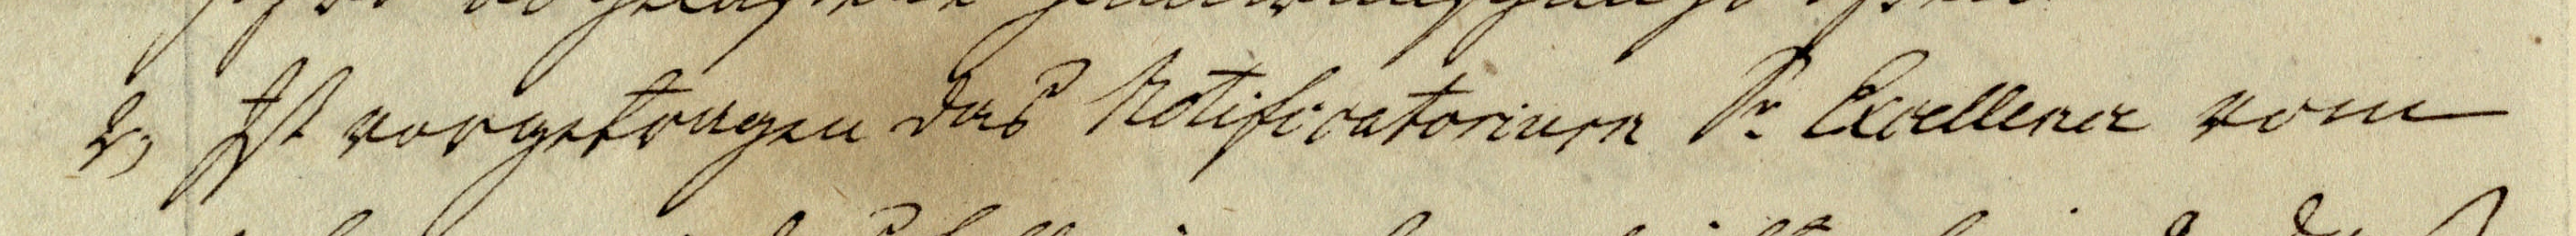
2., Ist vorgetragen das Notifcatorium Sr. Excellence vom
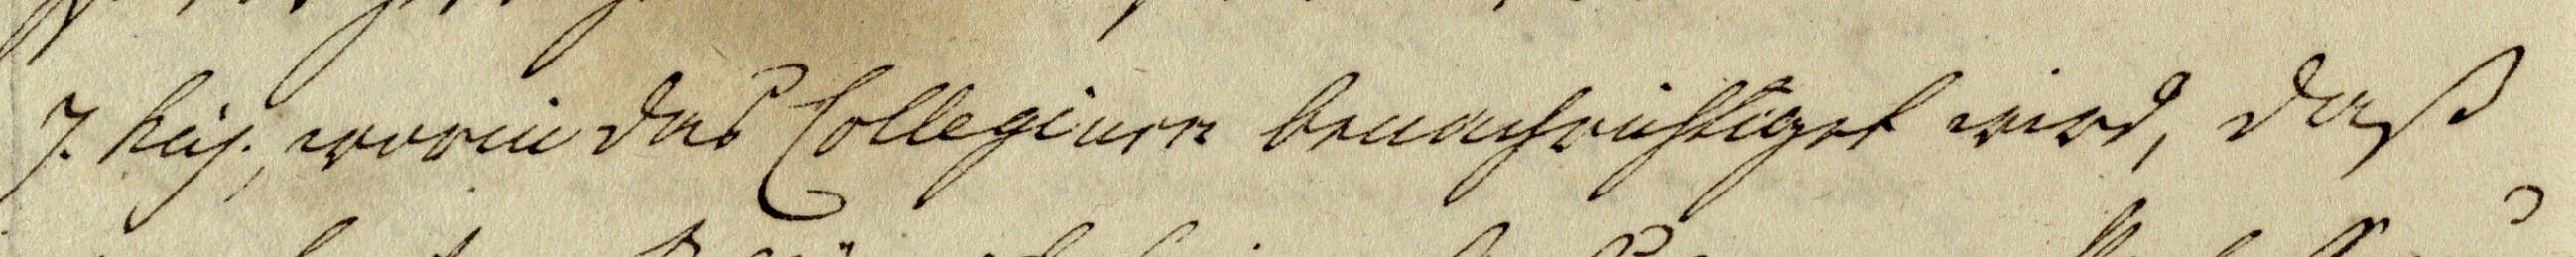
7. huj., worin das Collegium benachrichtiget wird, daß
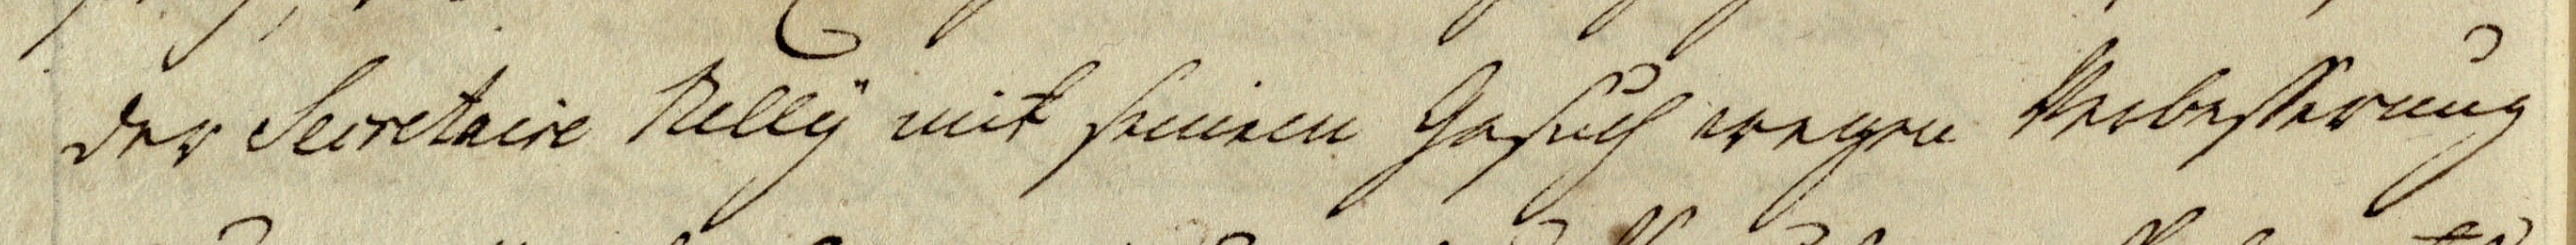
der Secretaire Nellÿ mit seinem Gesuch wegen Verbesserung
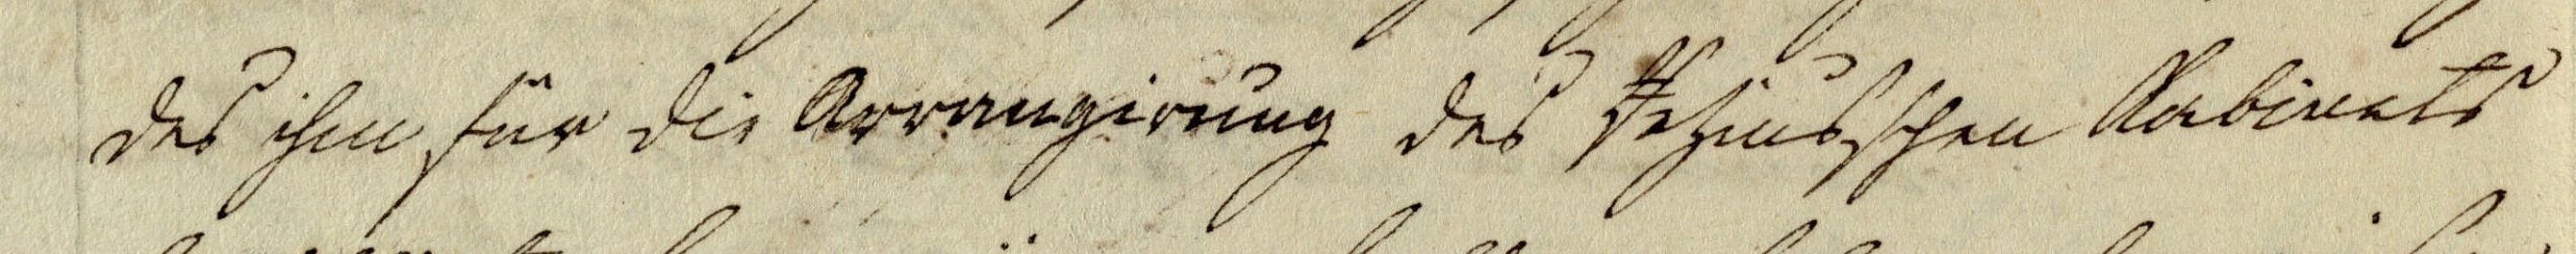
des ihm für die Arrangirung des Reziusschen Kabinets
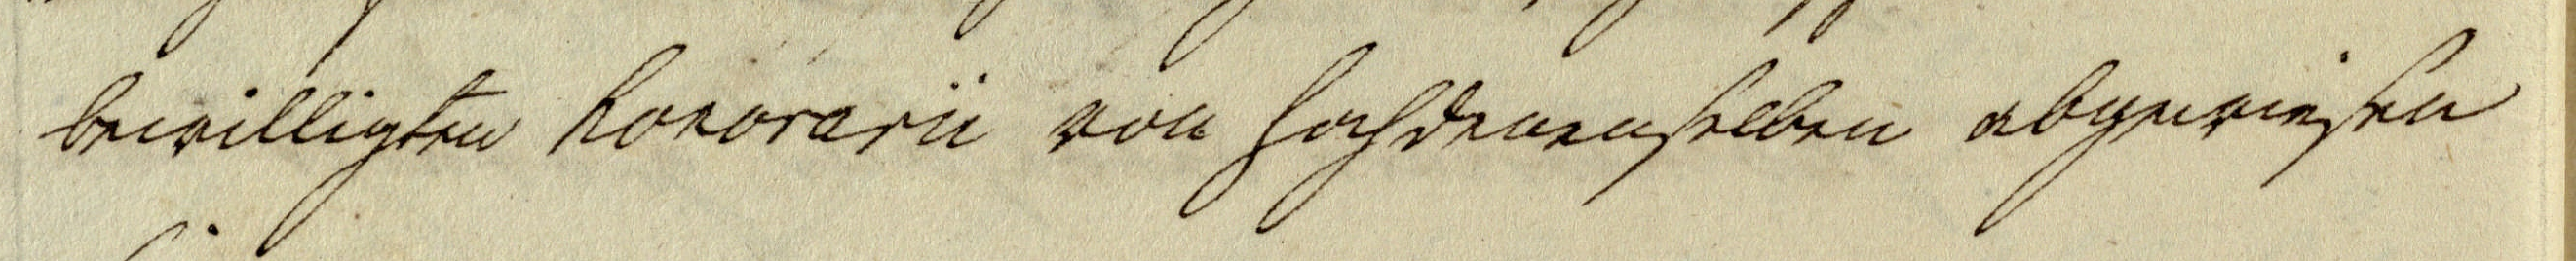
bewilligten honorarii von hochdenenselben abgewiesen
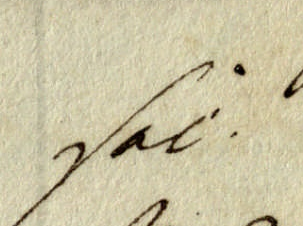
sei.
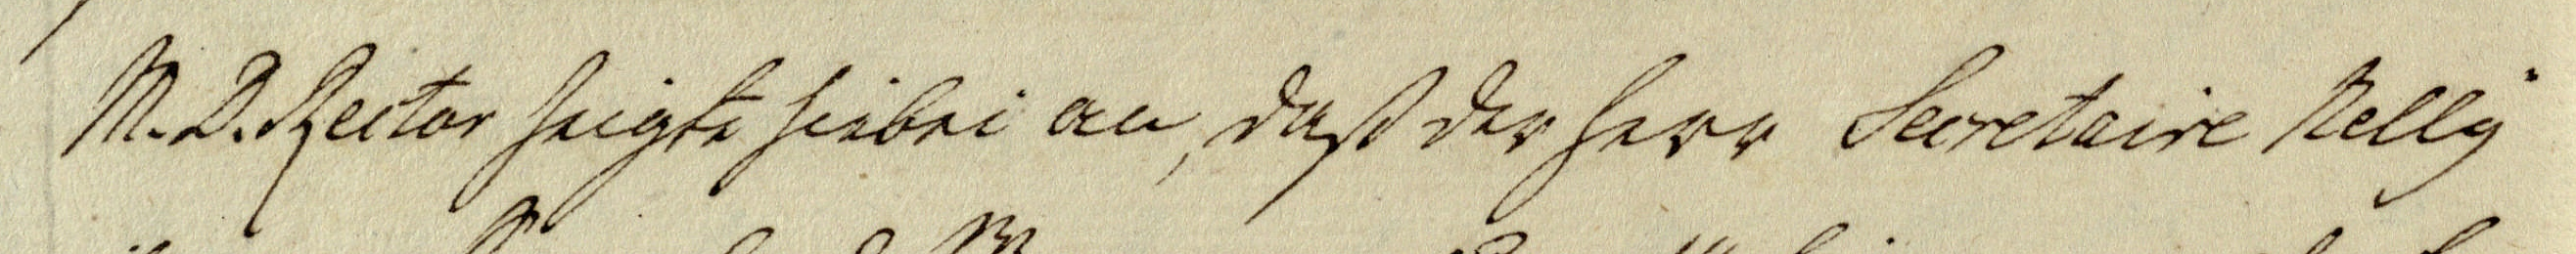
M. D. Rector zeigte hiebei an, daß der Herr Secretaire Nellÿ
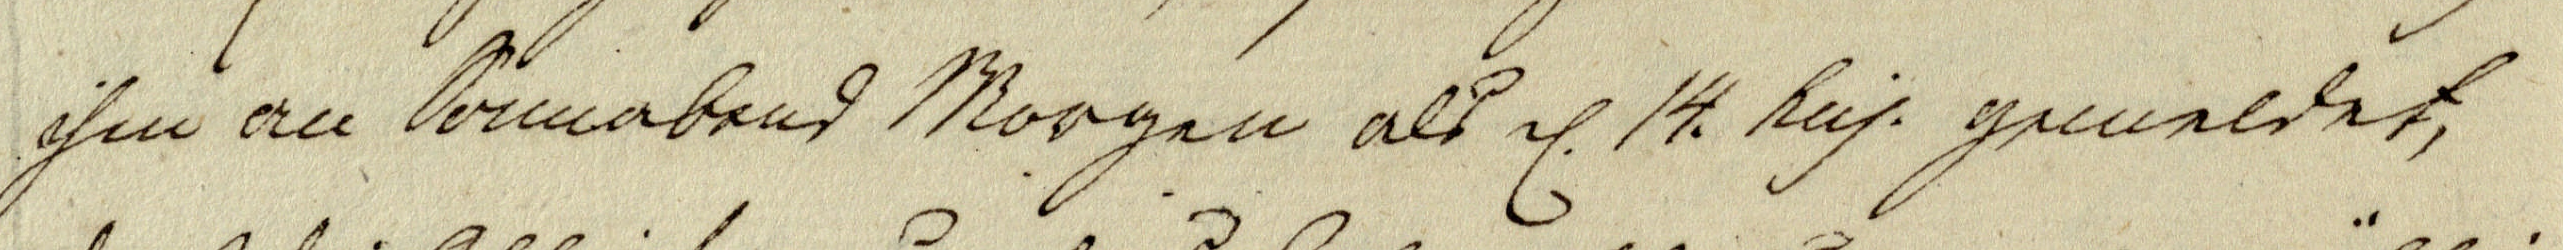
ihm an Sonnabend Morgen als d. 14. huj. gemeldet,
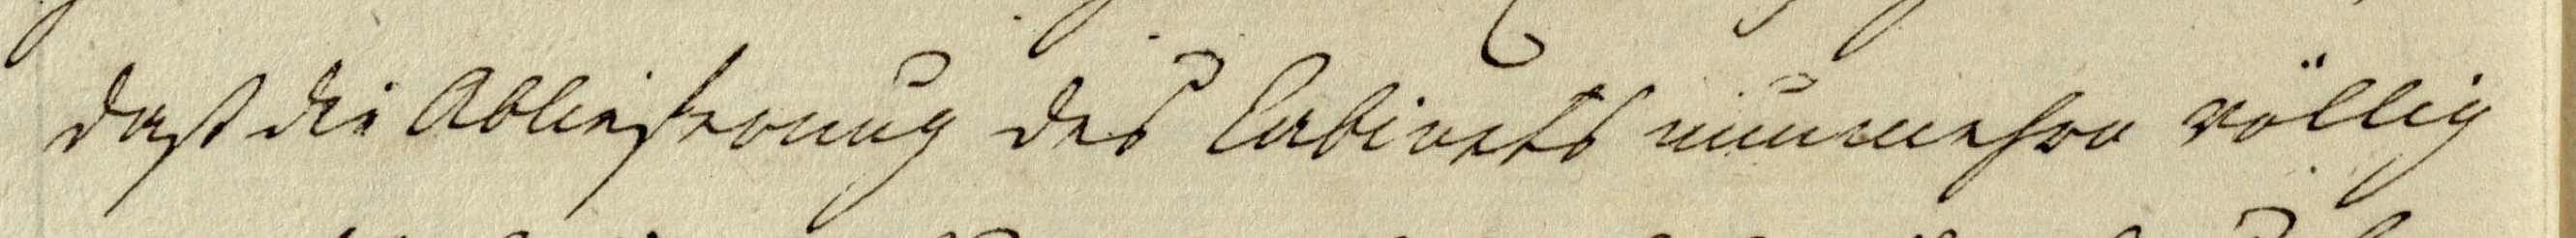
daß die Ablieferuug des Cabinets nunmehro völlig
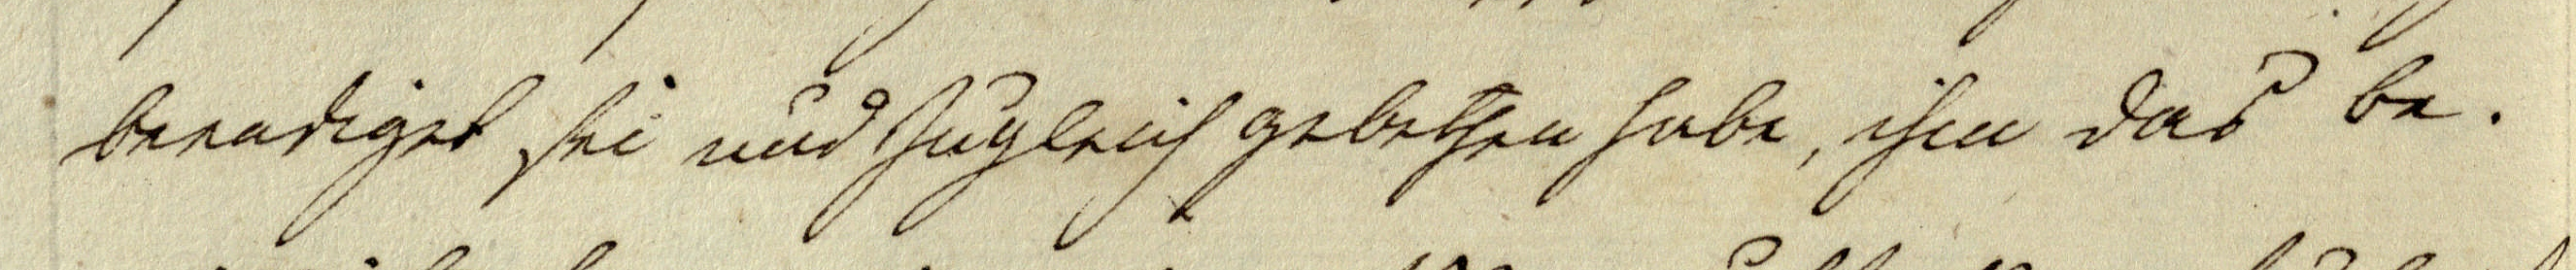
beendiget sei und zugleich gebethen habe, ihm das be¬
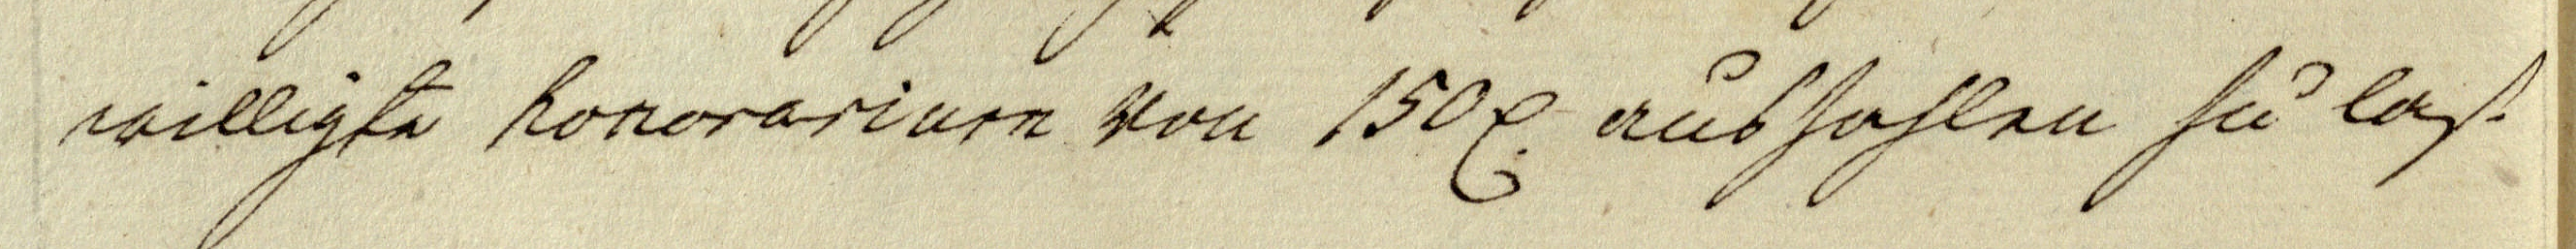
willigte honorarium von 150 l. auszahlen zu las¬
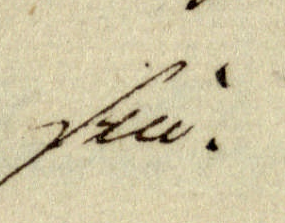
sen.
